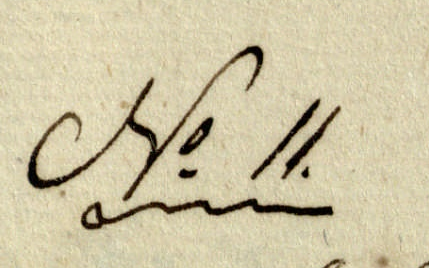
No 11.
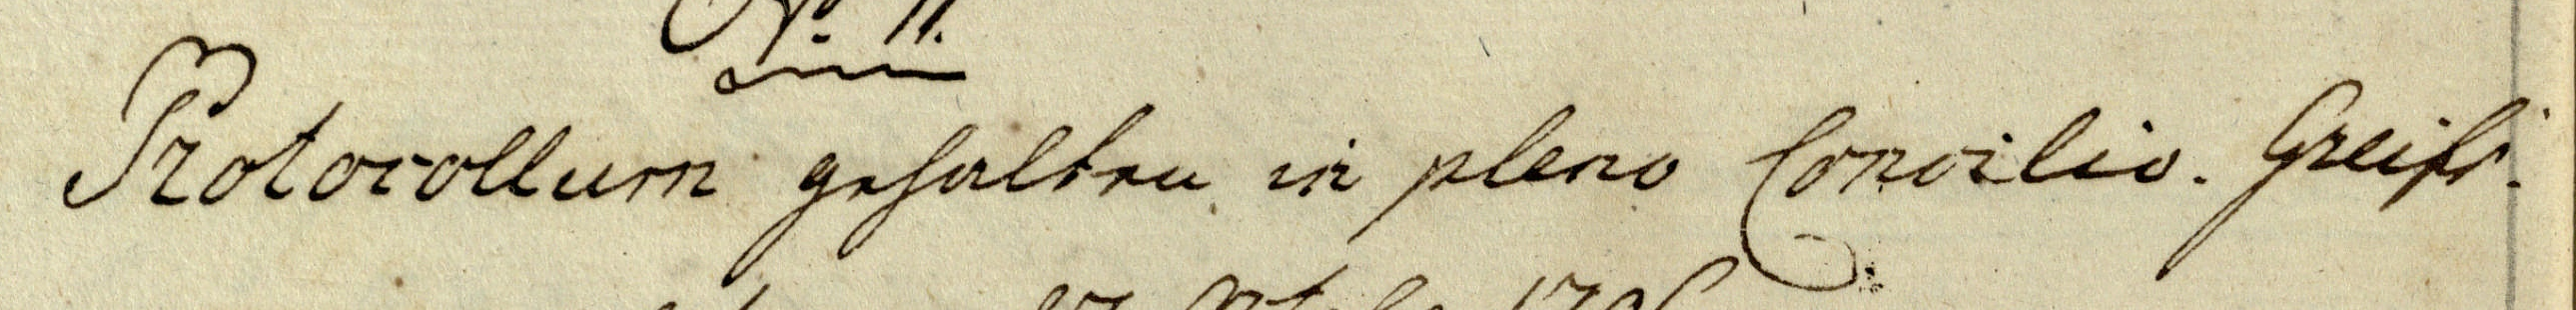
Protocollum gehalten in pleno Concilio. Greifs¬
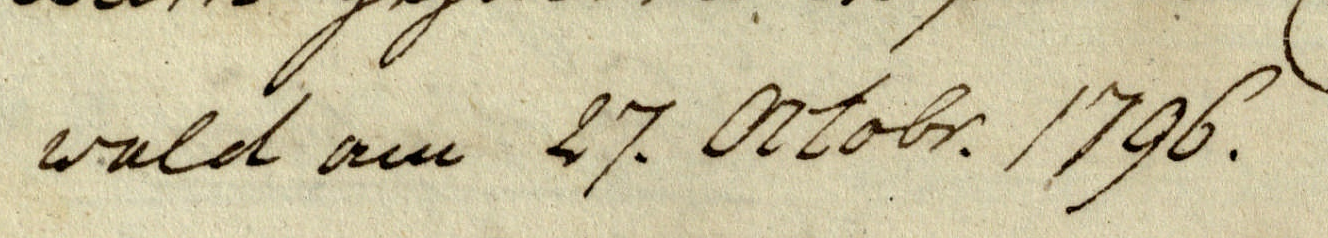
wald am 27. Octobr. 1796.
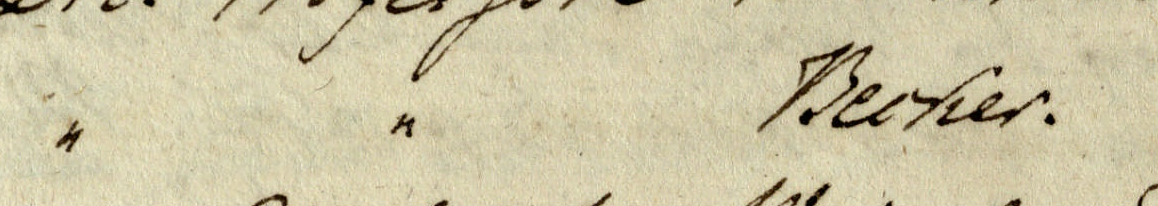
Becker.
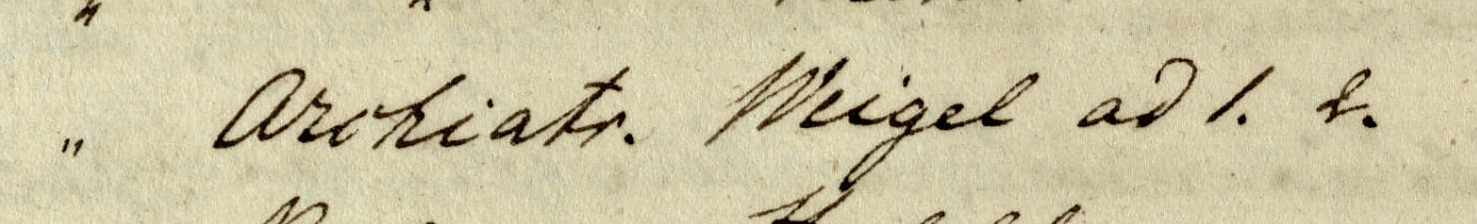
Archiatr. Weigel ad 1. 2.
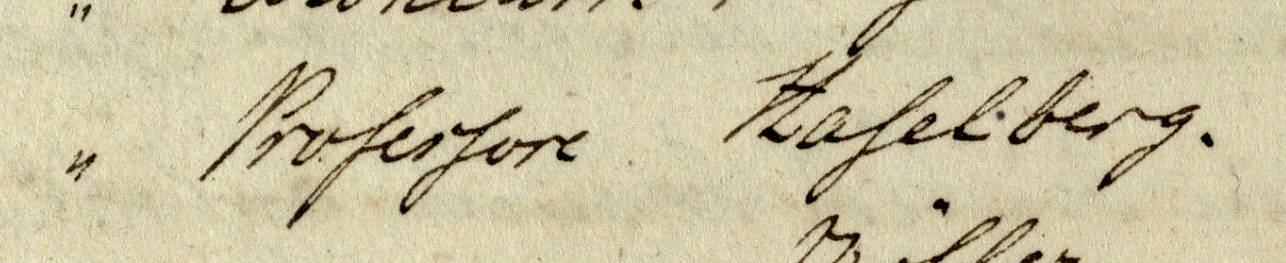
Professor Haselberg.
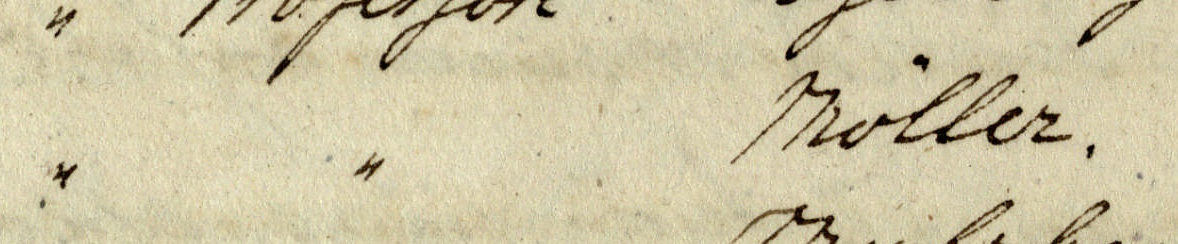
Möller.
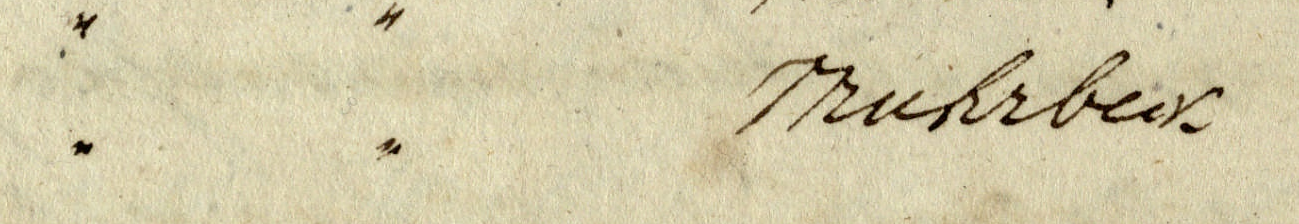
Muhrbeck
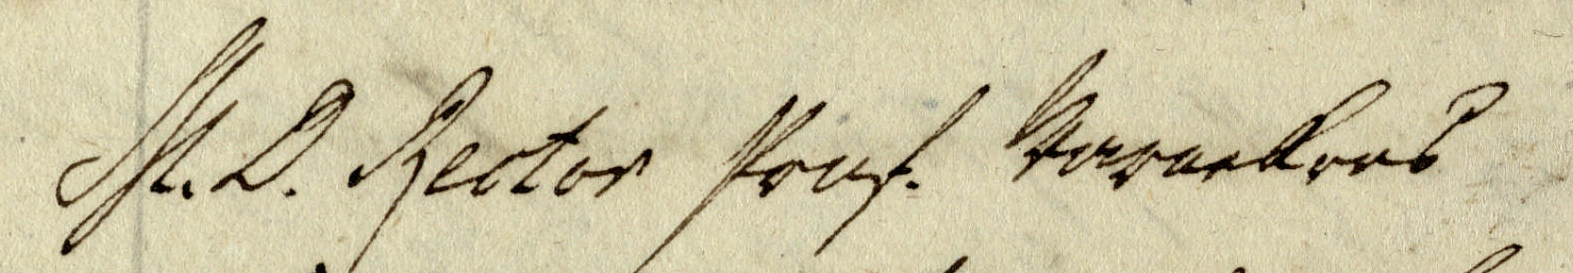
M. D. Rector Prof. Warnekros
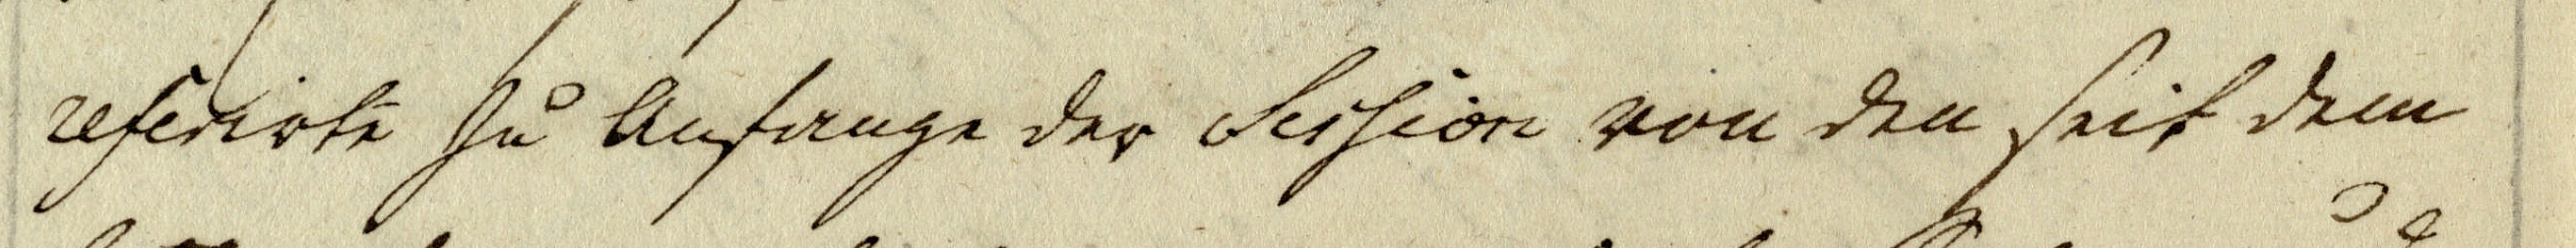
referirte zu Anfange der Session von den seit dem
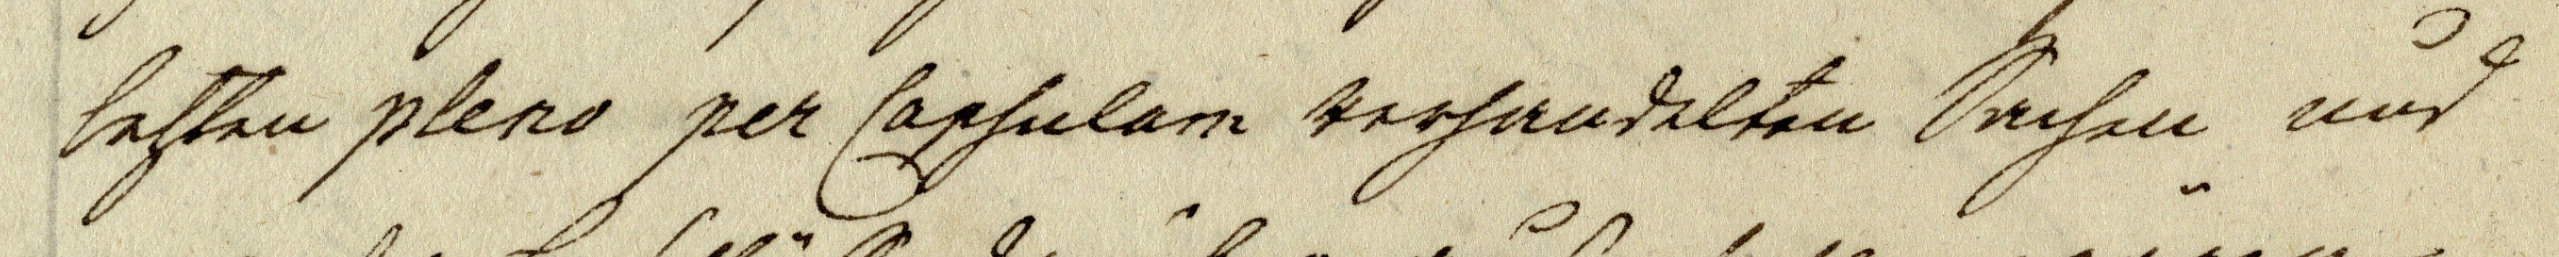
letzten pleno per Capsulam verhandelten Sachen und
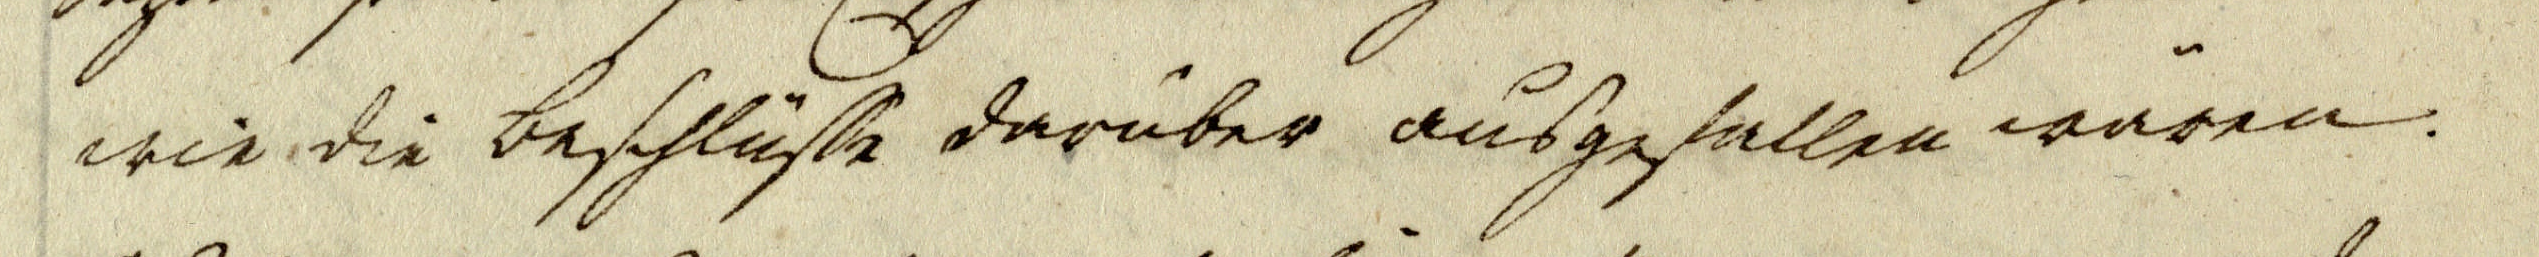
wie die Beschlüsse darüber ausgefallen wären.
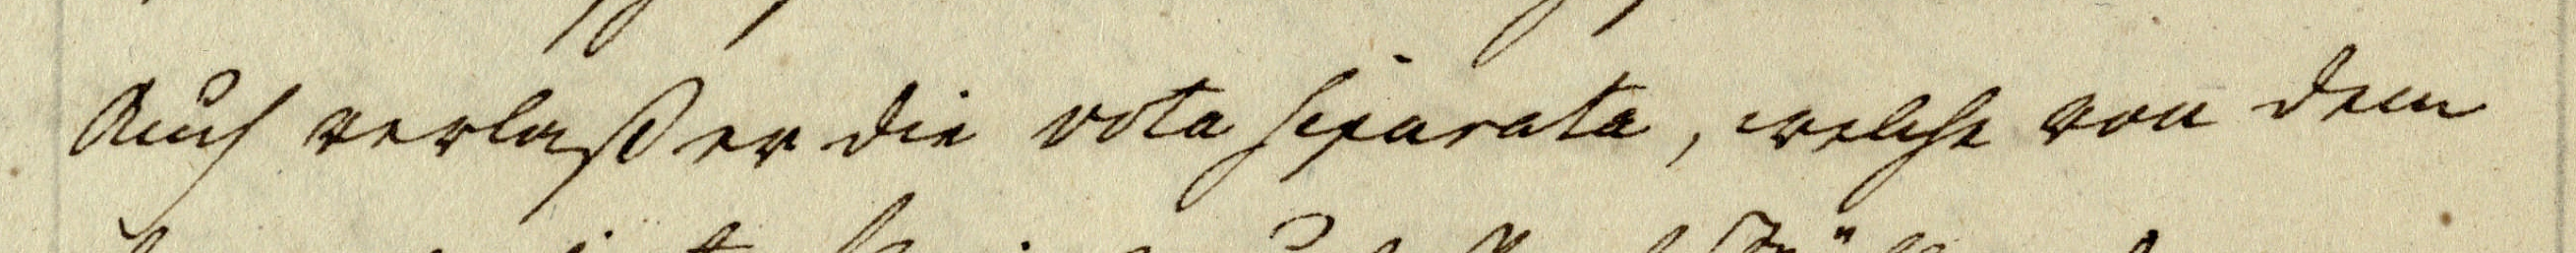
Auch verlaß er die vota separata, welche von dem
